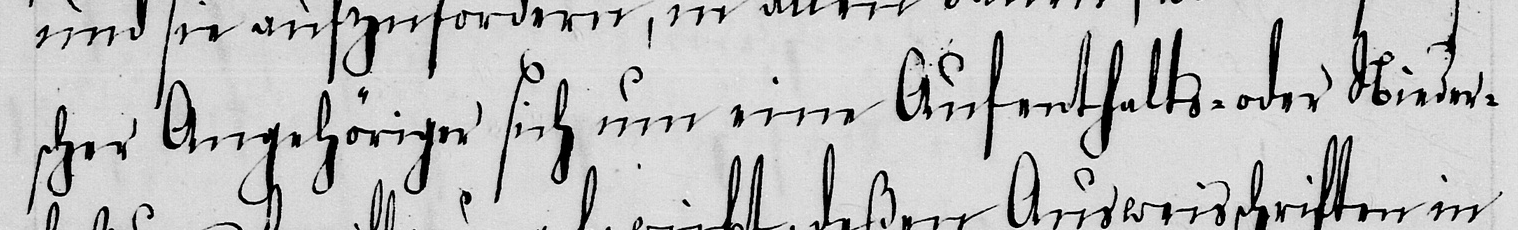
scher Angehöriger sich um eine Aufenthalts- oder Nieder¬
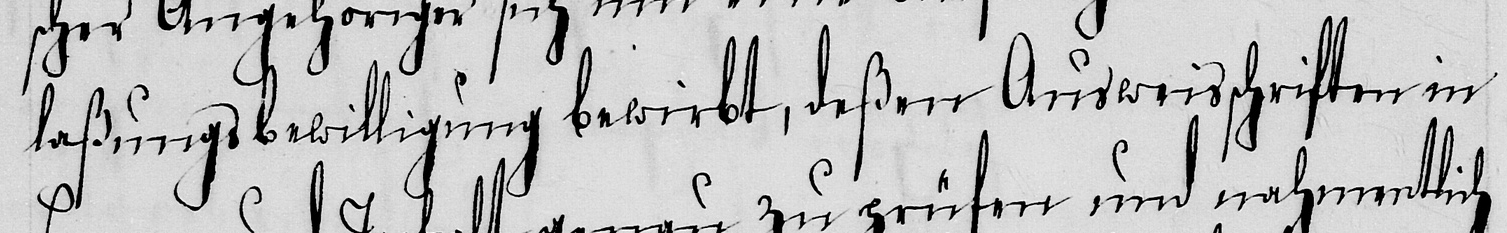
laßungsbewilligung bewirbt, deßen Ausweisschriften in
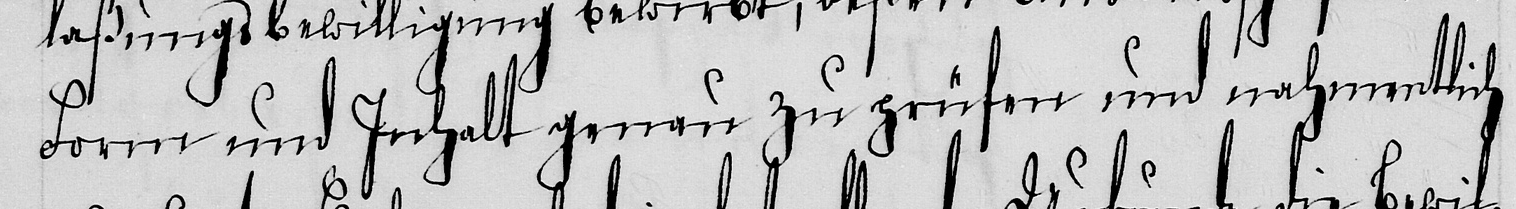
Form und Inhalt genau zu prüfen und nahmentlich
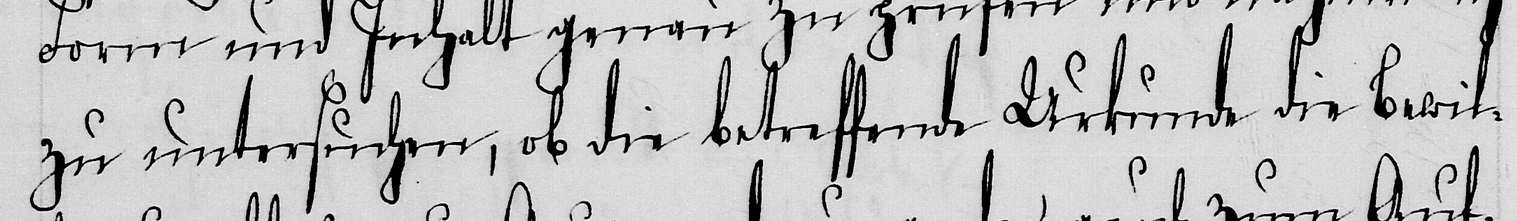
zu untersuchen, ob die betreffende Urkunde die Bewil¬
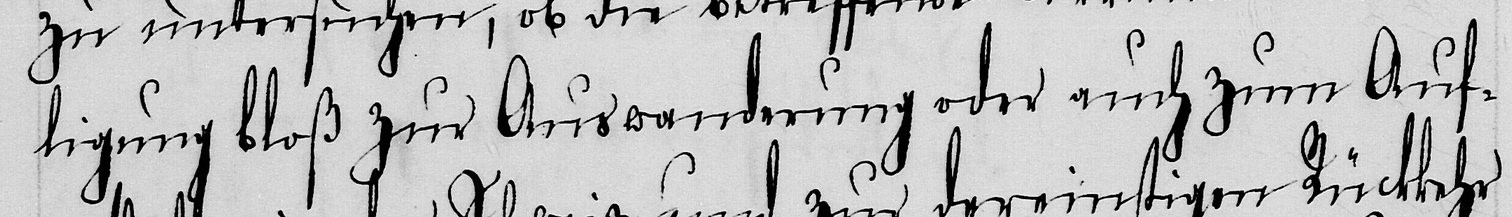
ligung bloß zur Auswanderung oder auch zum Auf¬
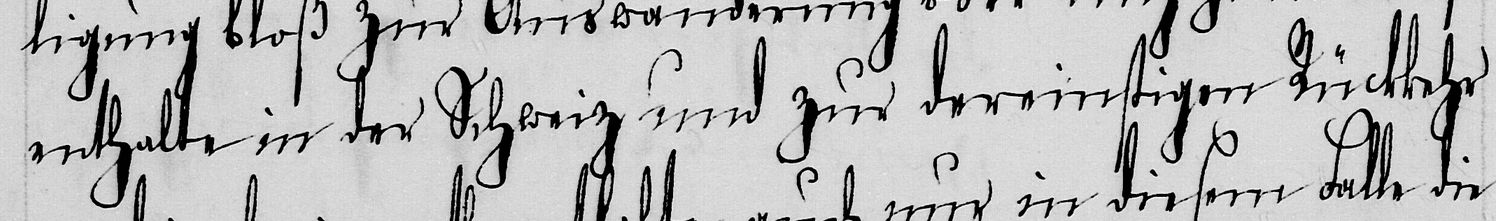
enthalte in der Schweiz und zur dereinstigen Rückkehr
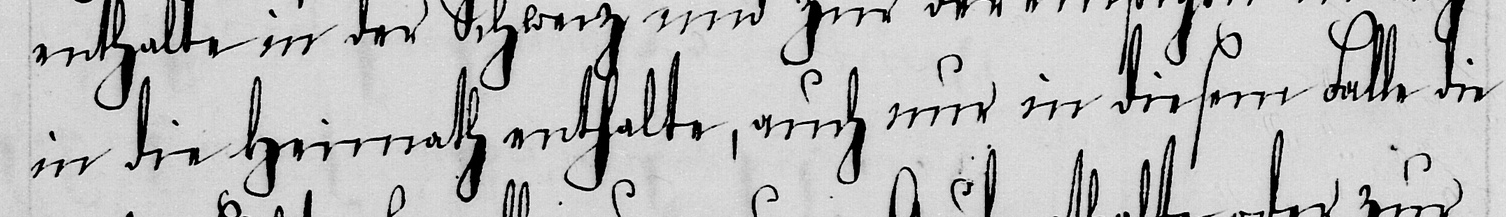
in die Heimath enthalte, auch nur in diesem Falle die
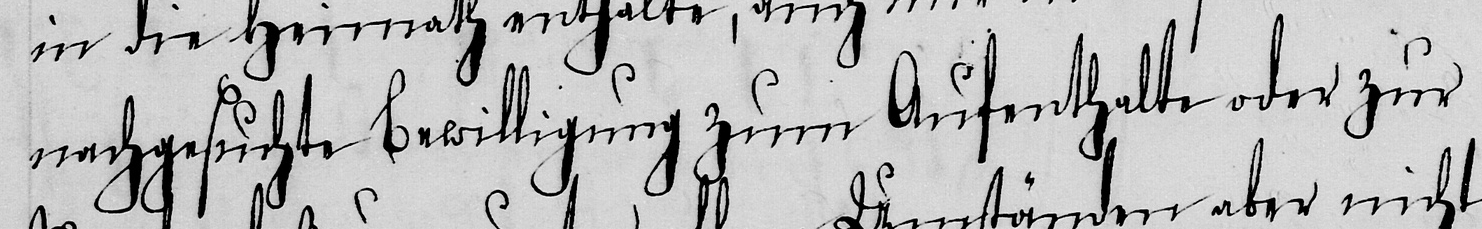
nachgesuchte Bewilligung zum Aufenthalte oder zur
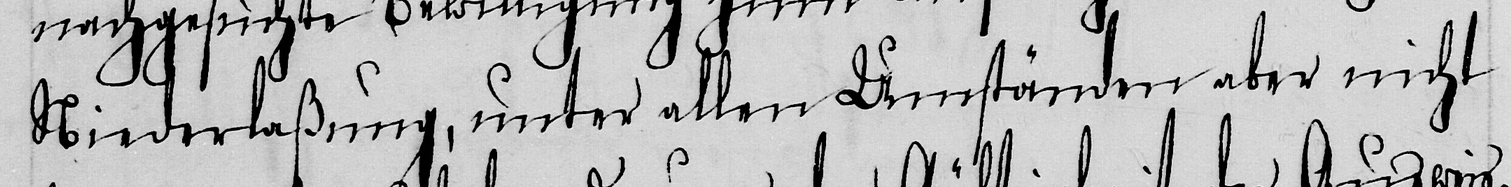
Niederlaßung, unter allen Umständen aber nicht
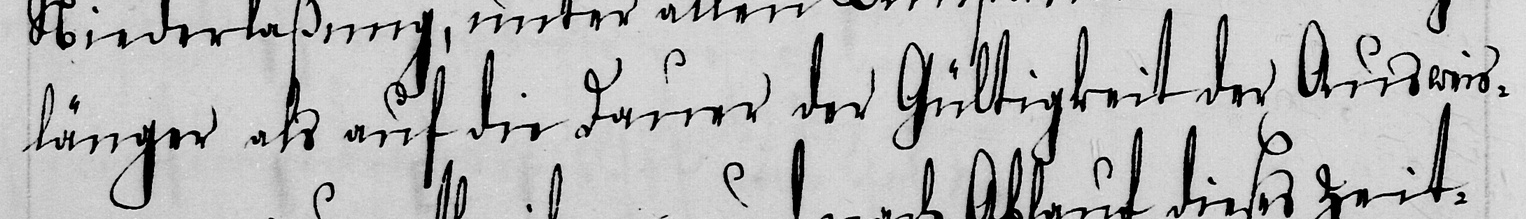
länger als auf die Dauer der Gültigkeit der Ausweis¬
